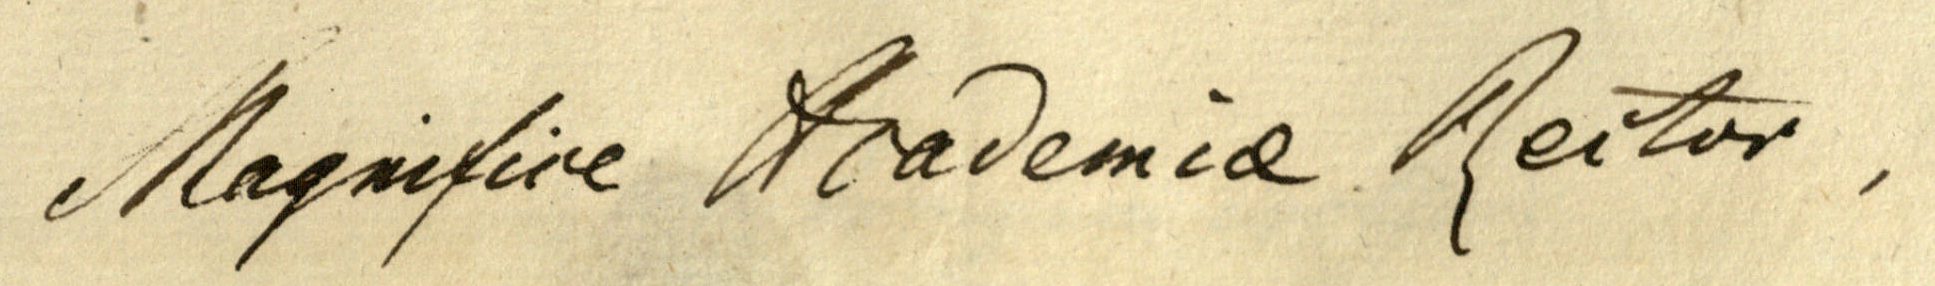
Magnifice Academiae Rector,
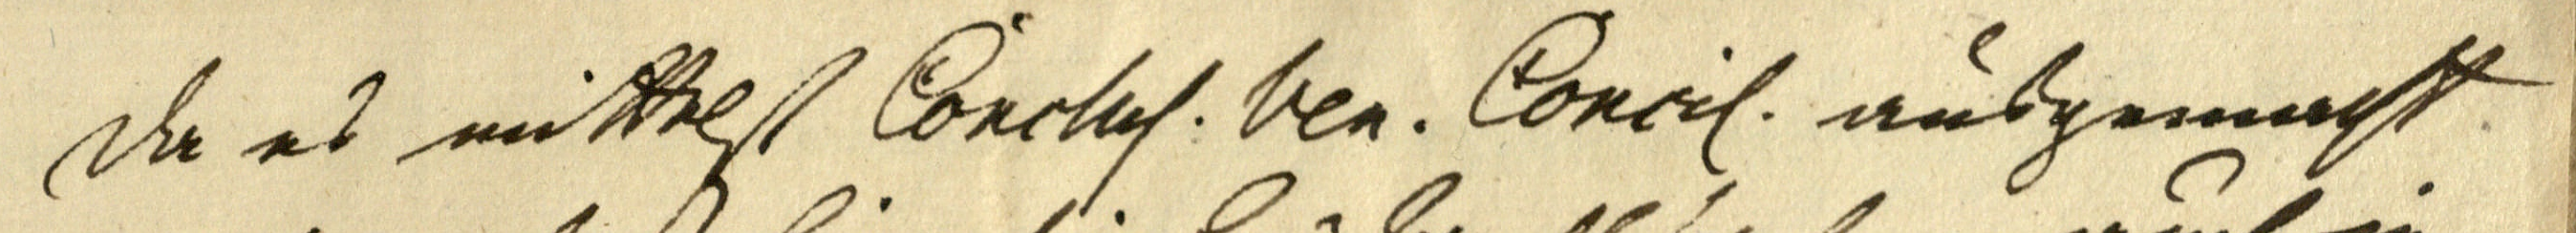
Da es mittelst Conclus. Ven. Conccil. ausgemacht
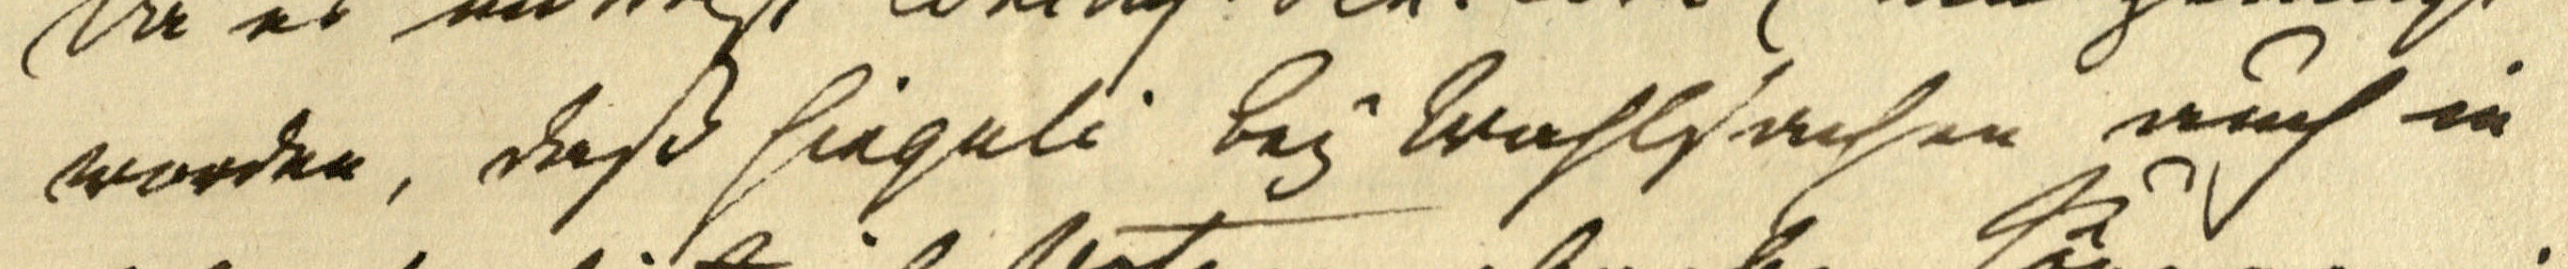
worden, daß singuli bey Wahlsachen auch in
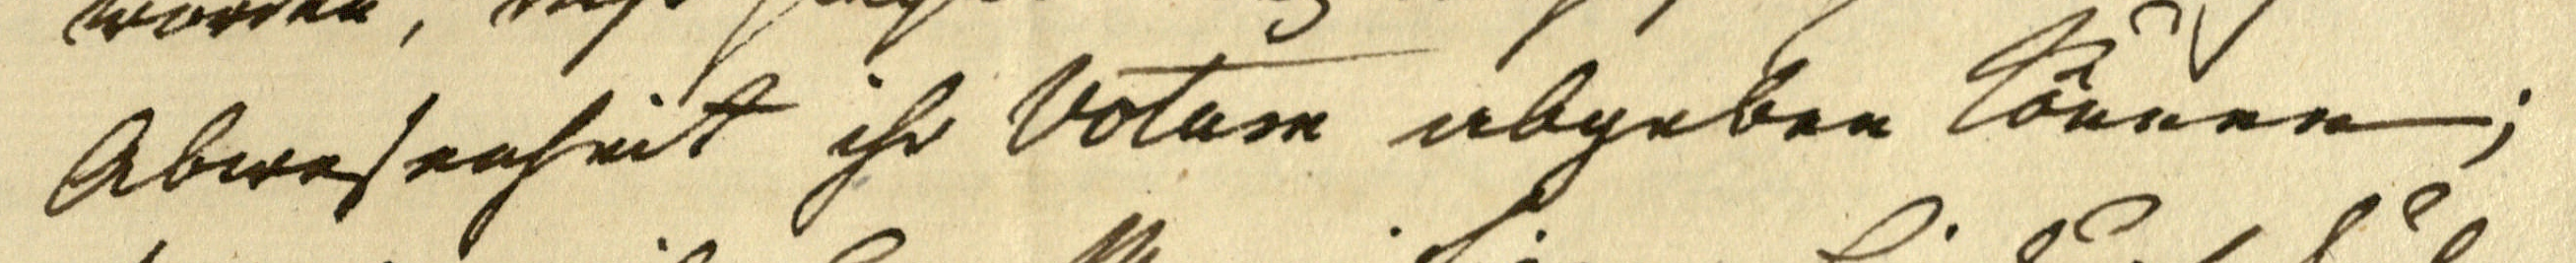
Abwesenehit ihr Votum abgeben können,
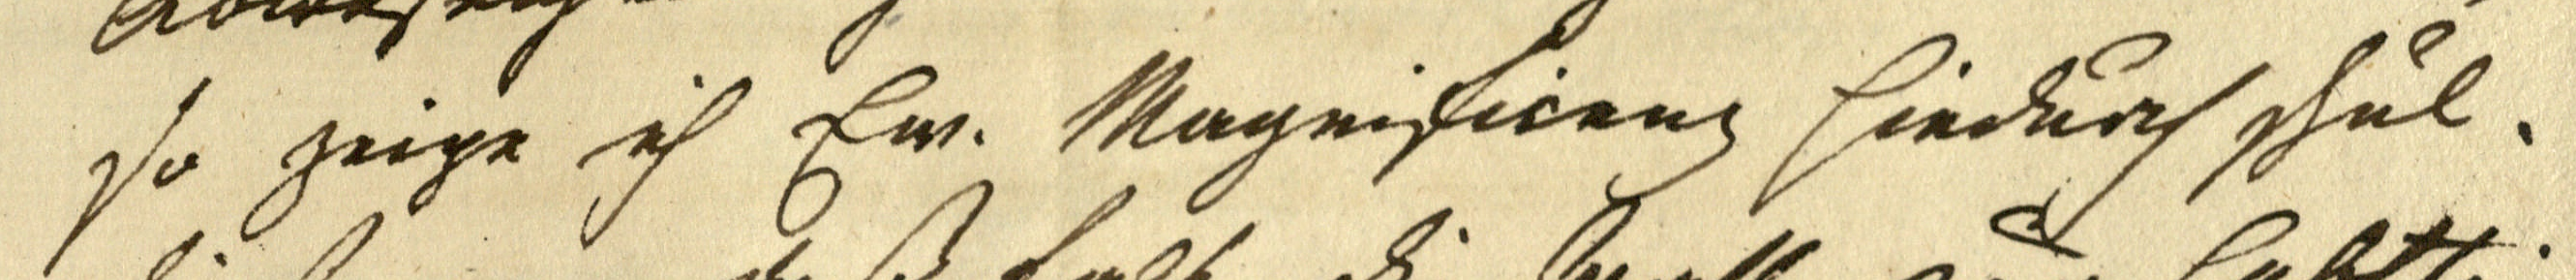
so zeige ich Ew. Magnificence hiedurch schul-
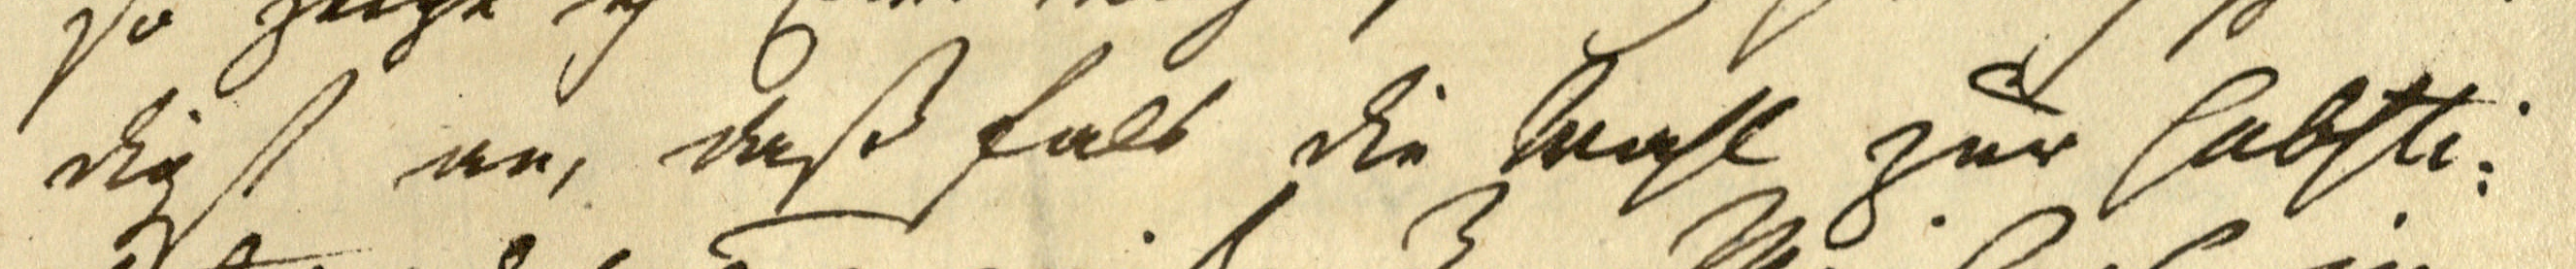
digst an, daß fals die Wahl zur substi-
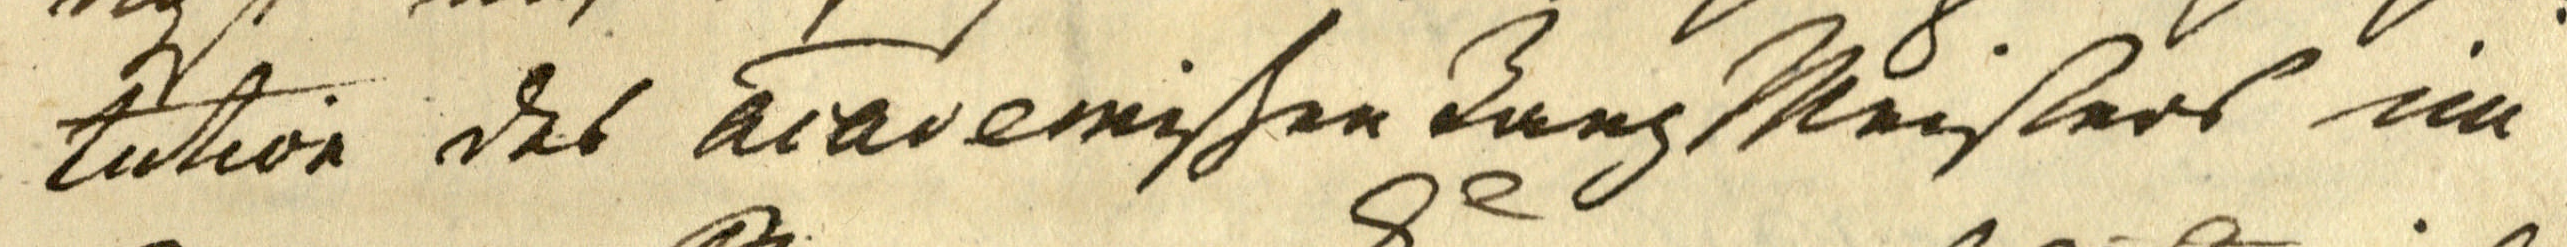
tution des academischen Tanz Meisters im
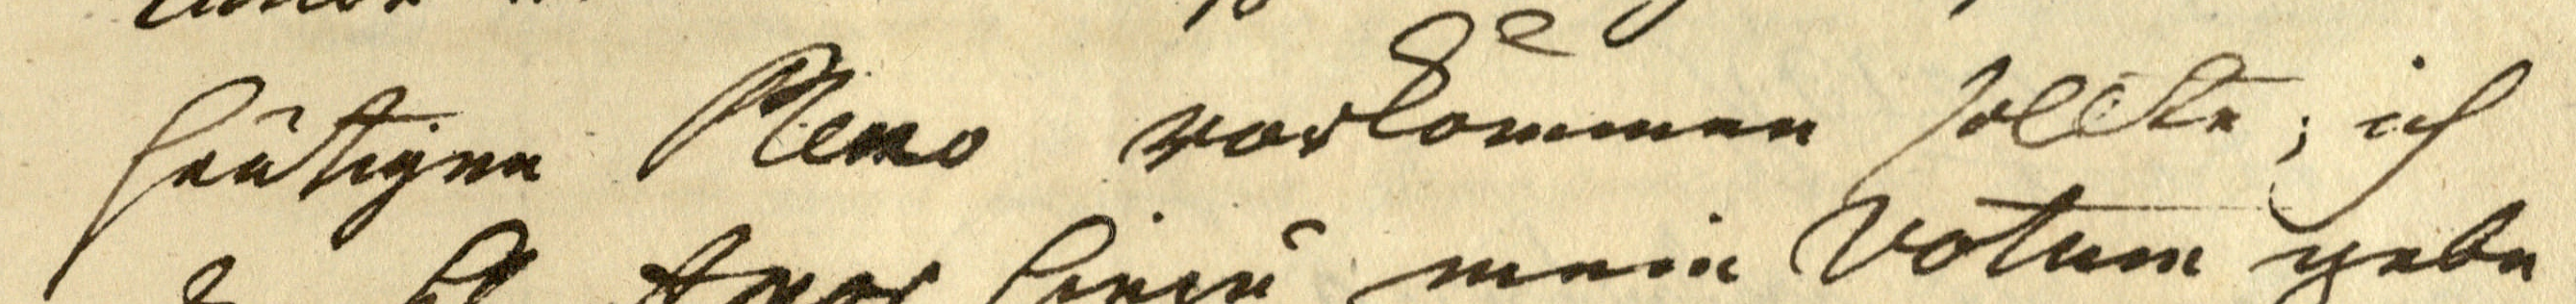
heutigen Pleno vorkommen sollte, ich
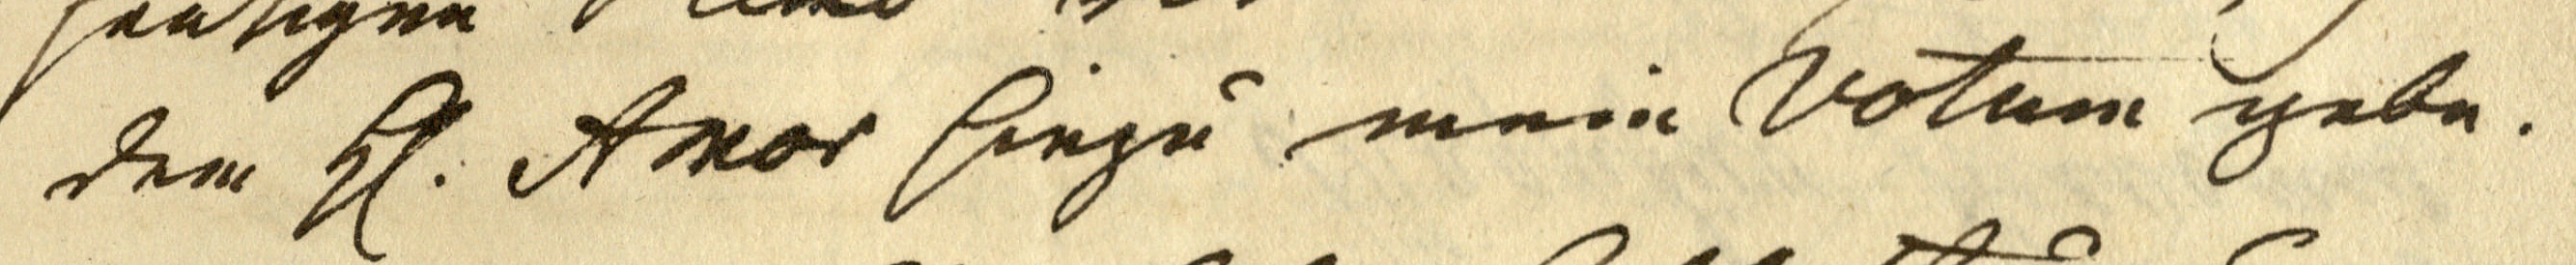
dem H. Amor hiezu mein votum gebe.
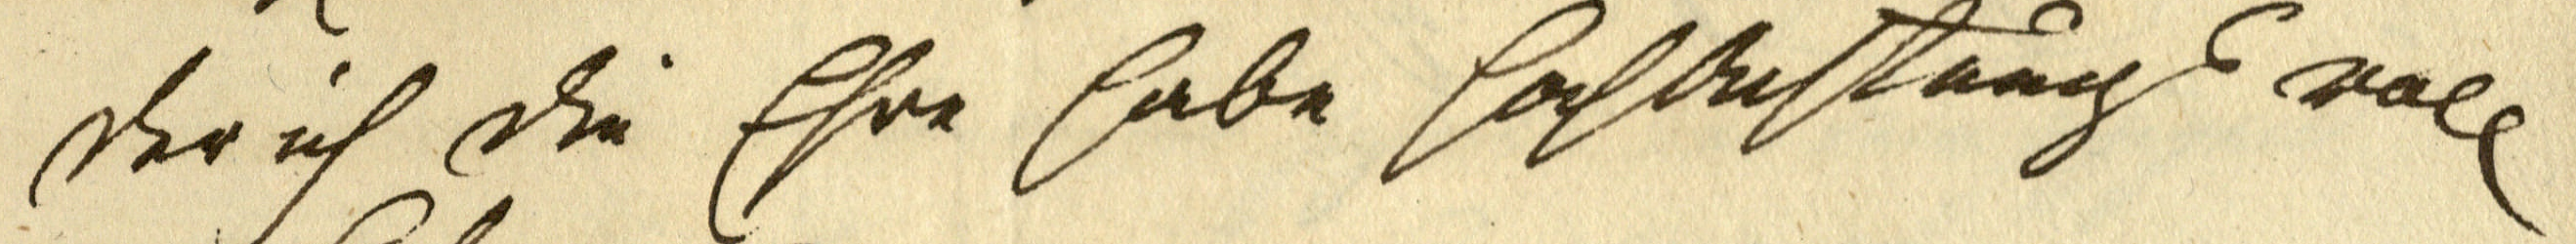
Der ich die Ehre habe hochachtungsvoll
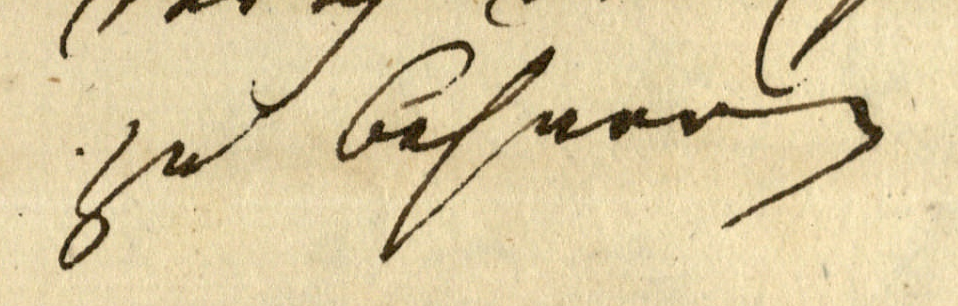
zu beharren
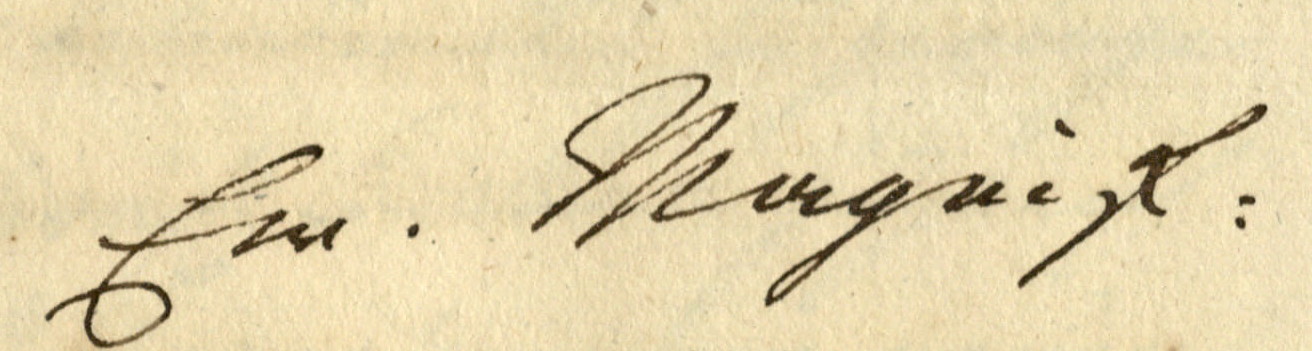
Ew. Magnif:
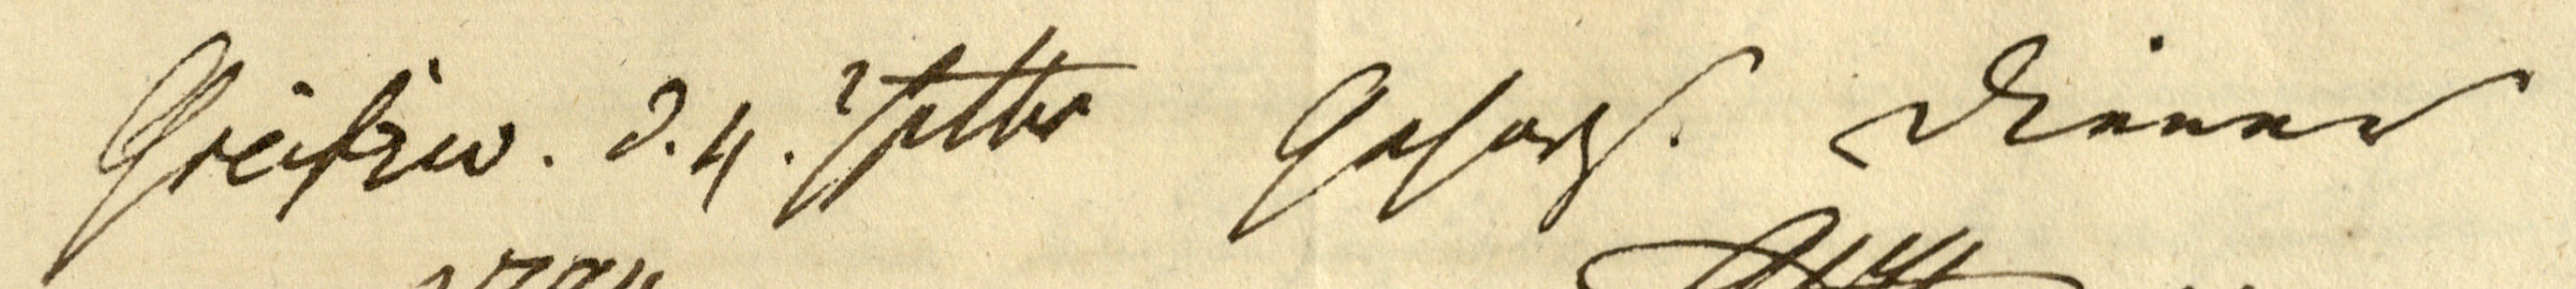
Greifsw. d. 4. Septbr. Ghors. Diener
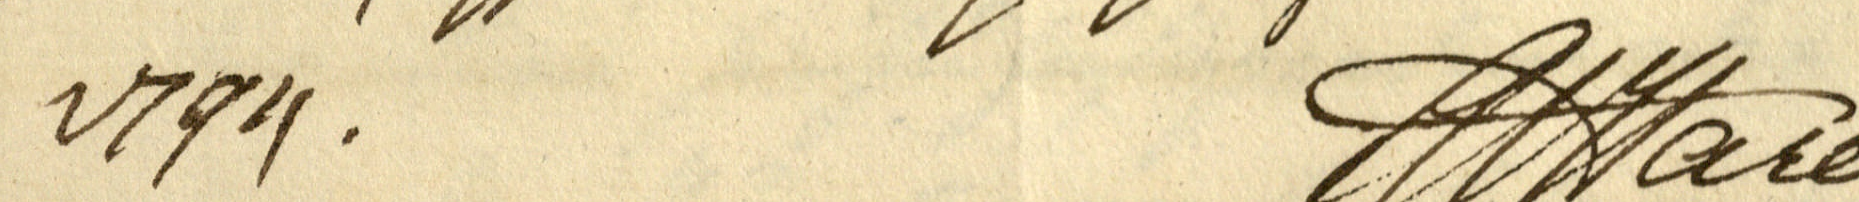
1794
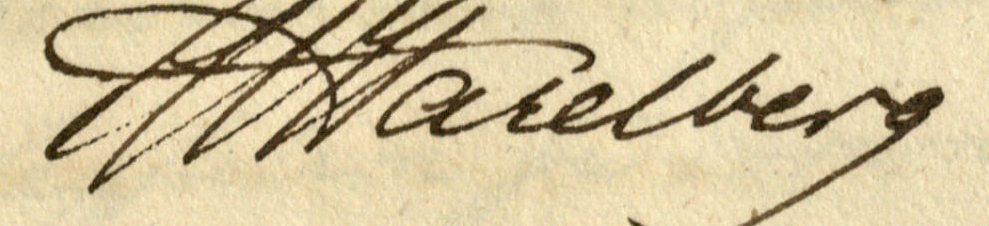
Haselberg
